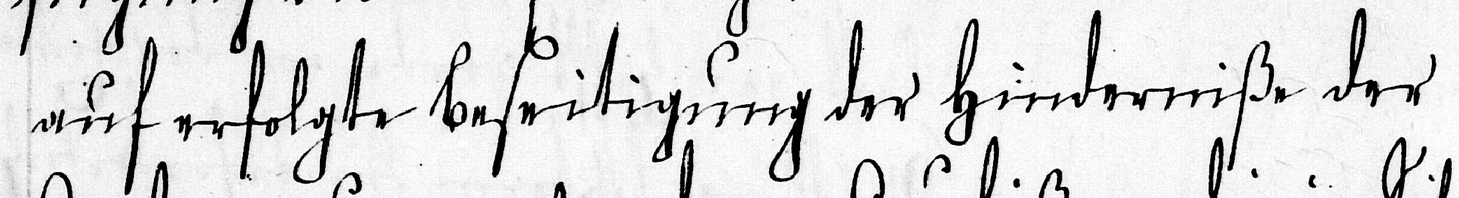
auf erfolgte Beseitigung der Hinderniße der
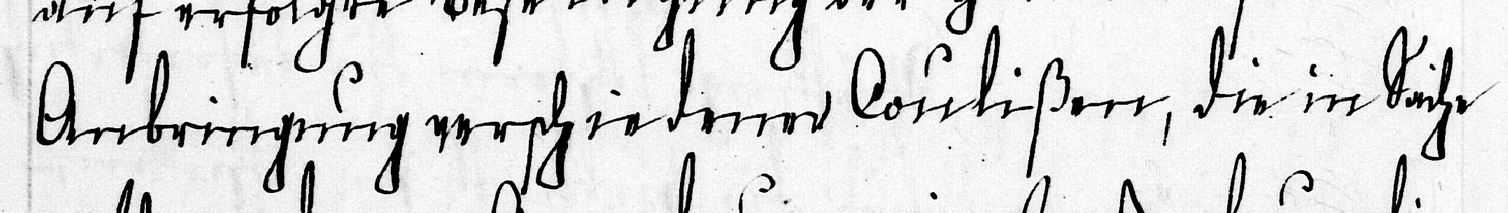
Anbringung verschiedener Coulißen, die in Sache
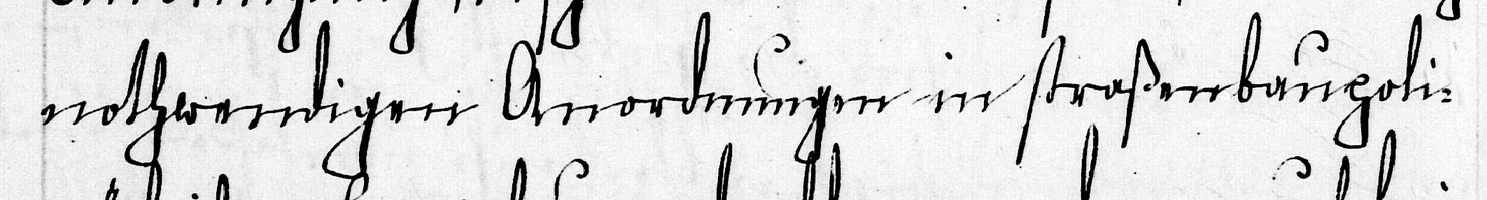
nothwendigen Anordnungen in straßenbaupoli¬
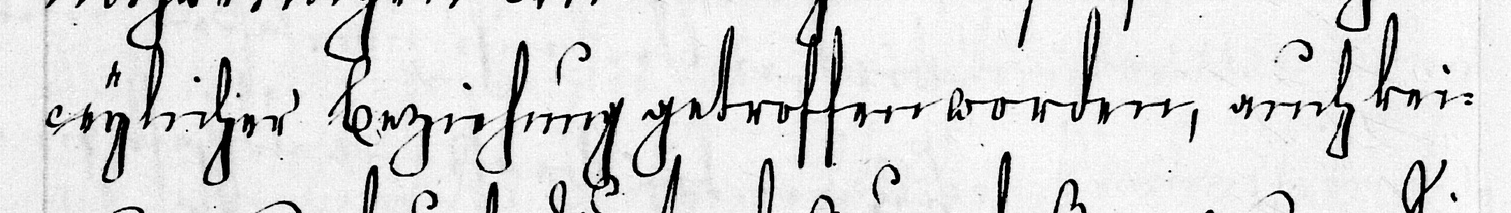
ceylicher Beziehung getroffen worden, auch kei¬
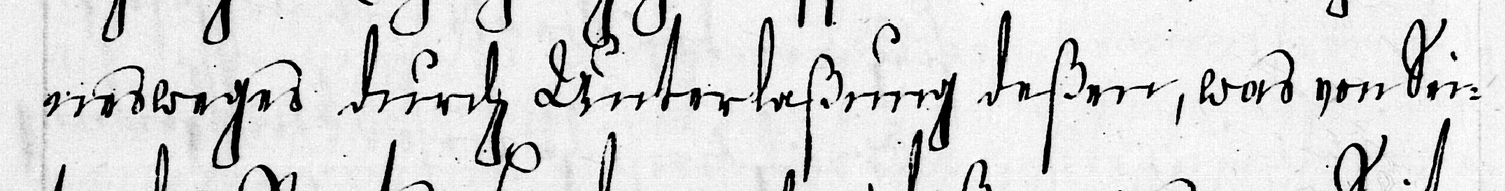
neswegs durch Unterlaßung deßen, was von Sei¬
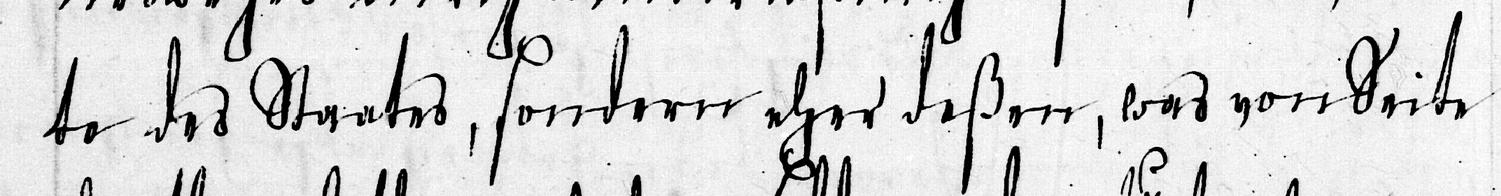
te des Staates, sondern eher deßen, was von Seite
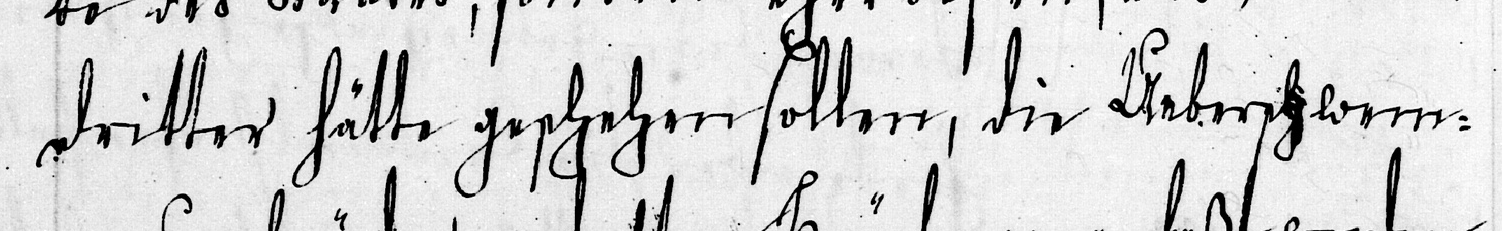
Dritter hätte geschehen sollen, die Ueberschwem¬
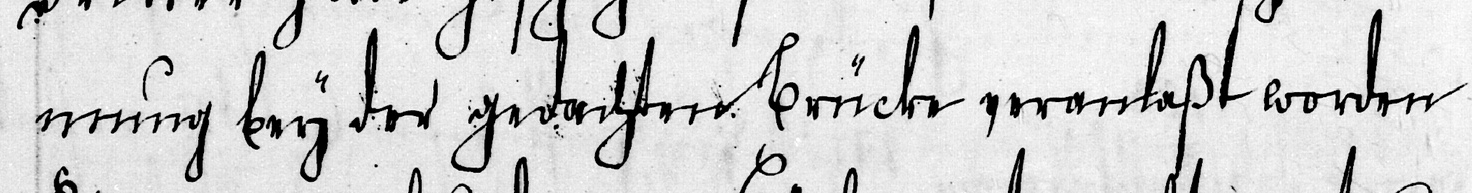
mung bey der gedachten Brücke veranlaßt worden
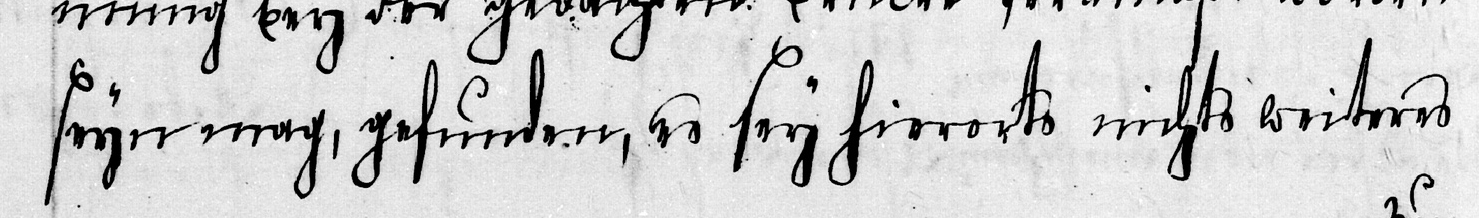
seyn mag, gefunden, es sey hierorts nichts weiteres
